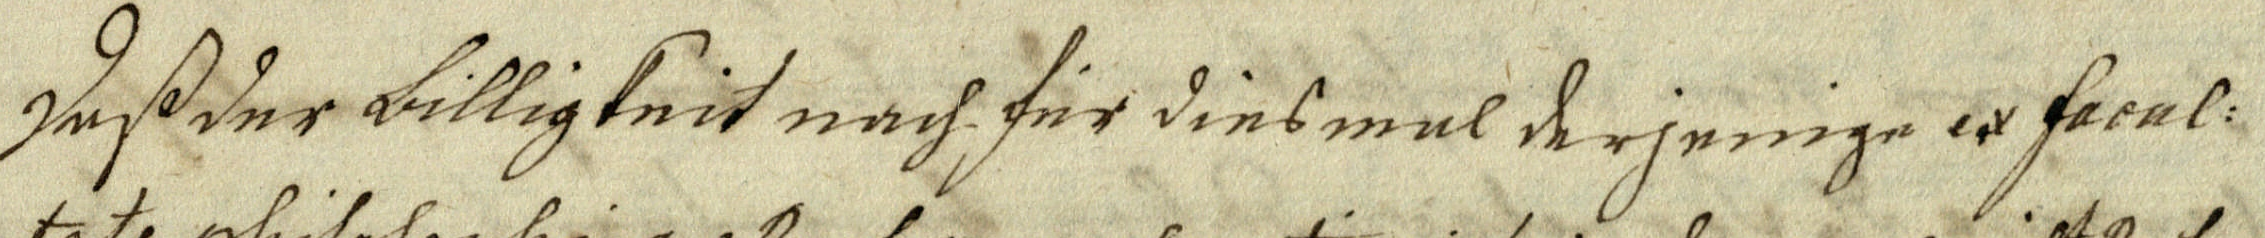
Daß der Billigkeit nach für diesmal derjenige ex facul¬
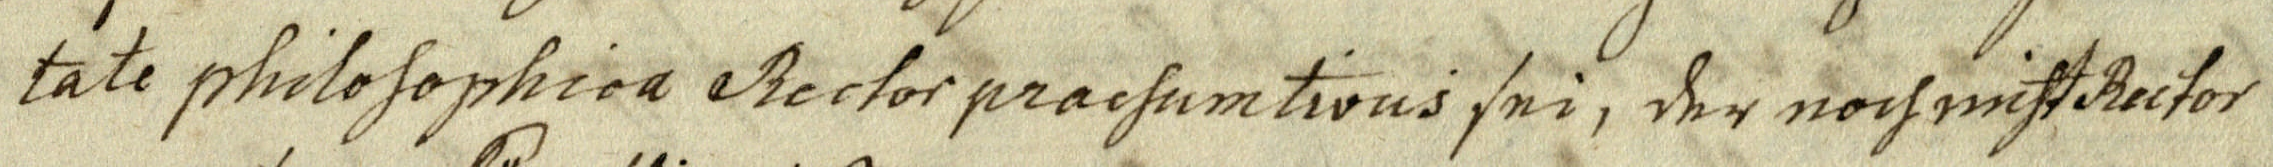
tate philosophica Rector praesumtivus sei, der noch nicht Rector
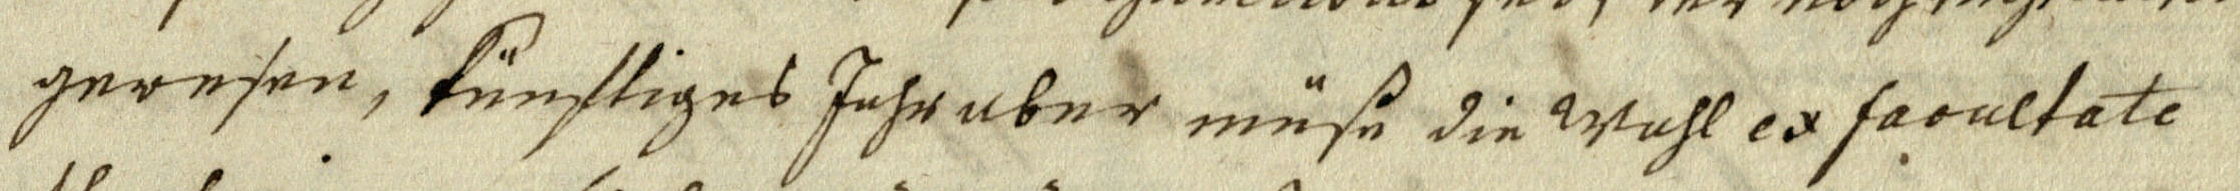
gewesen, künftiges Jahr aber müße die Wahl ex facultate
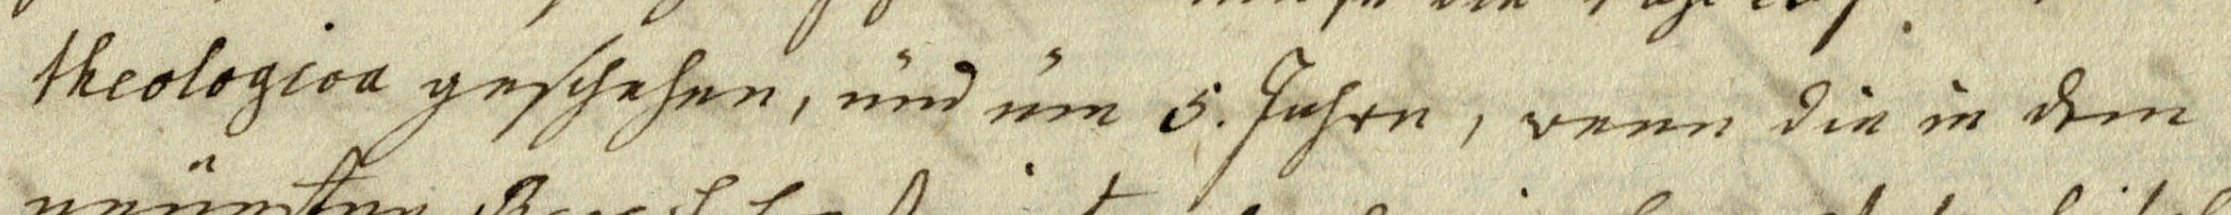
theologica geschehen, und um 5. Jahre, wenn die in dem
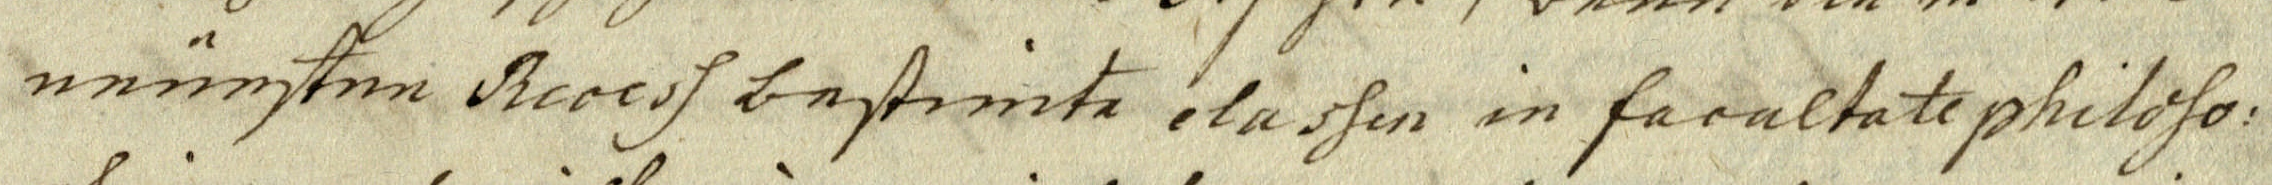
neuesten Recess bestimte classen in facultate philoso¬
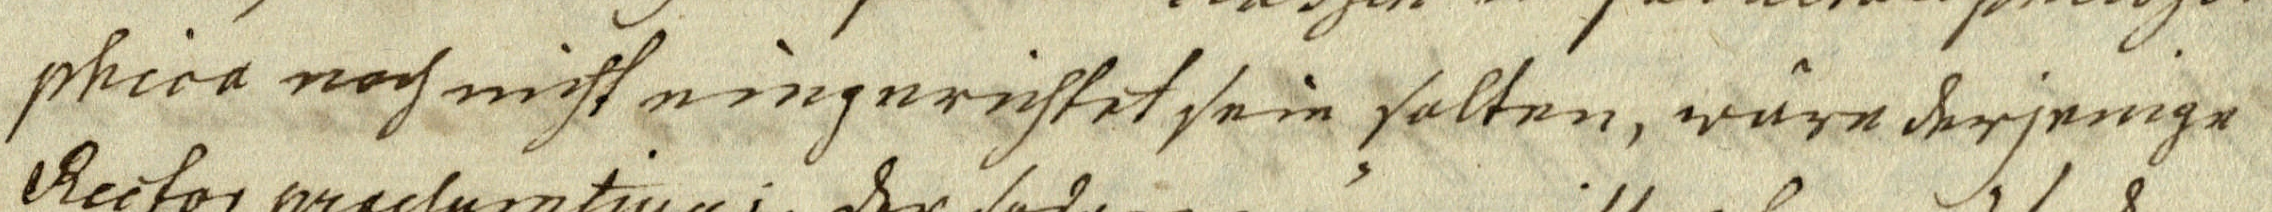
phica noch nicht eingerichtet sein solten, wäre derjenige
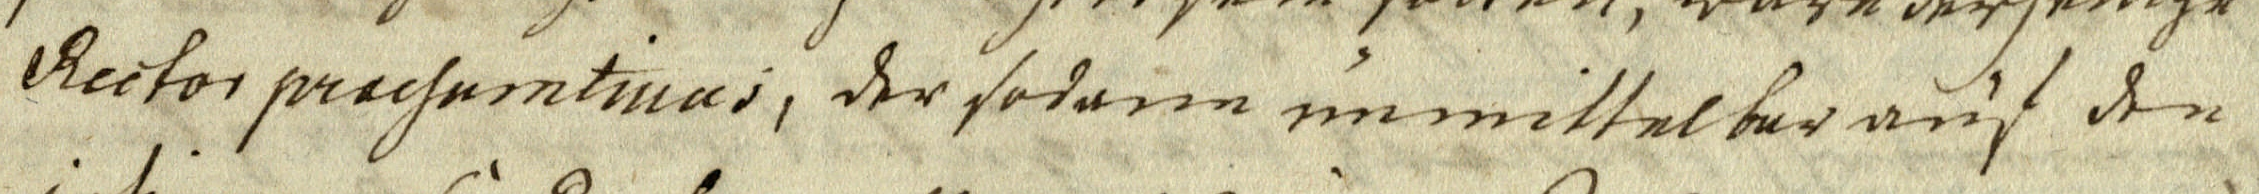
Rector praesumtivus, der sodann unmittelbar auf den
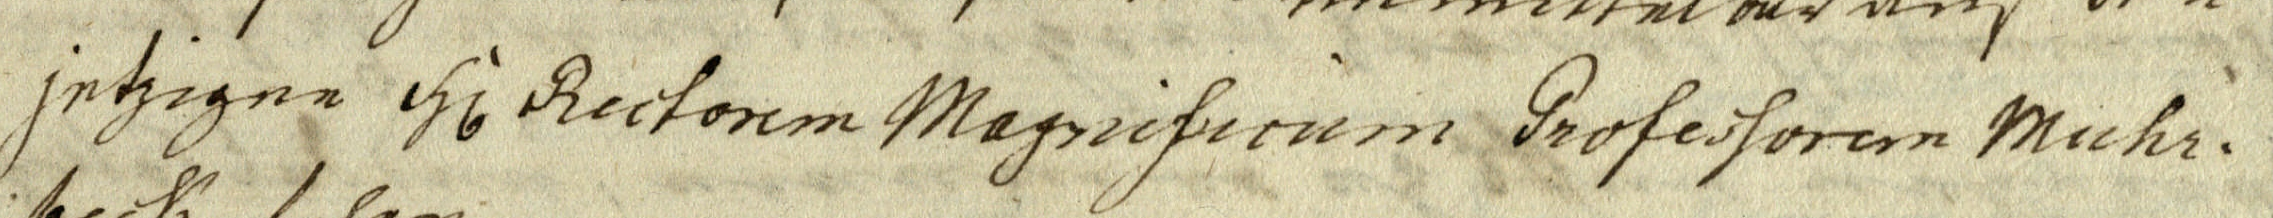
jetzigen H. Rectorem Magnificum Professorem Muhr¬
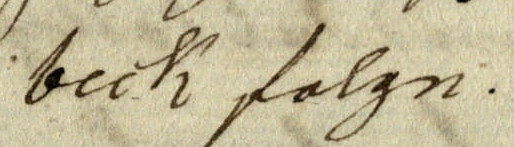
beck folge.
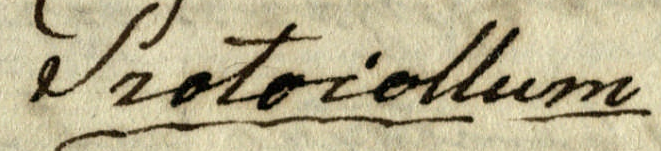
Protocollum
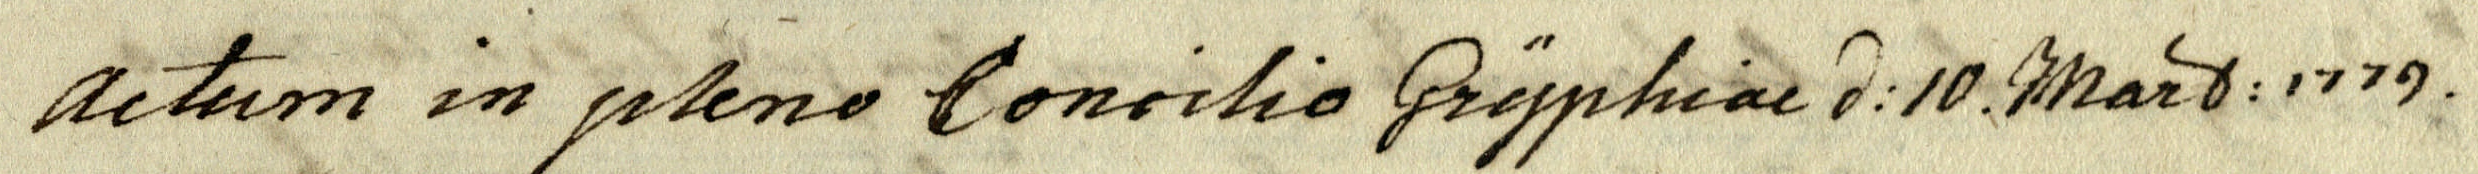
Actum in pleno Concilio Grÿphiae d. 10. Mart 1779.
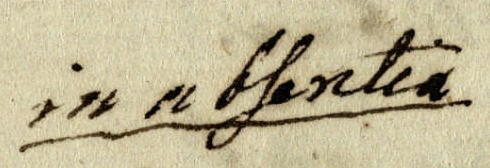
in absentia
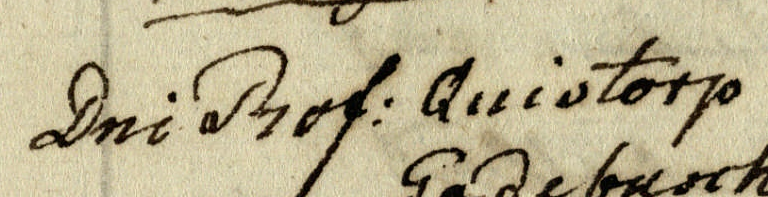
Dni Prof. Quistorp
